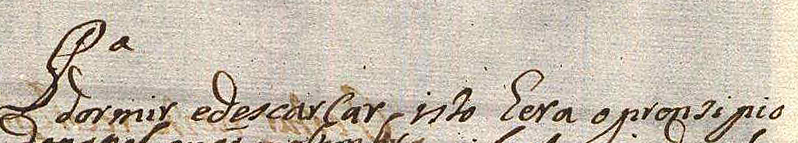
Pa dormir e descarçar isto hera o prensipio
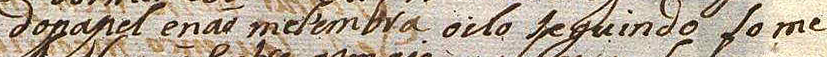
do papel e naõ me lembra o elo seguindo so me
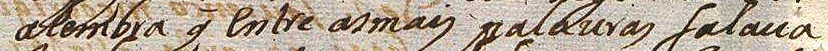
alembra q̄ Entre as mais palauras falaua
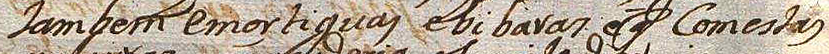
tambem e mortiguas e bibaras e q̄ Com estas
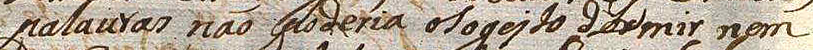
palauras naõ poderia o sogejto domir nem
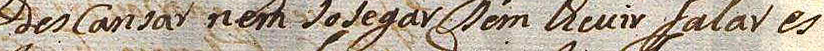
desCansar nem sosegar sem lhe uir falar es
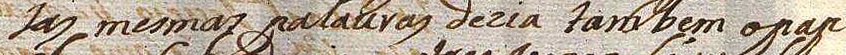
tas mesmas palauras dezia tambem o pap
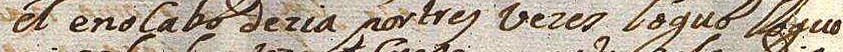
el e no Cabo dezia por tres vezes loguo loguo
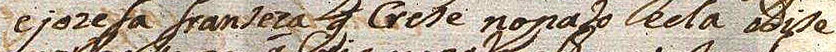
e jozefa franseza q̄ crese no pato e ela o dise
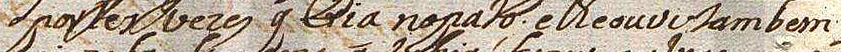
por tes vezes q̄ Cria no pato; e lhe ouve tambem
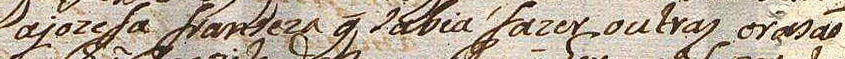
a jozeja franseza q̄ sabia fazer outras orasão
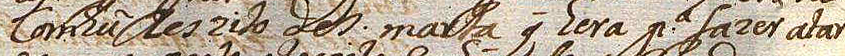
Com hū Reszito de s. marta q̄ hera p.a fazer atar
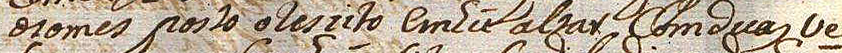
os omes posto o Reszito em hū altar Com duas ve
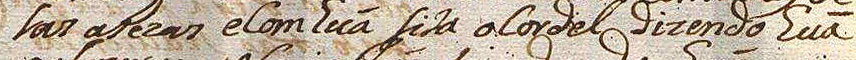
las asezas e Com huā fita o Cordel dizendo huā
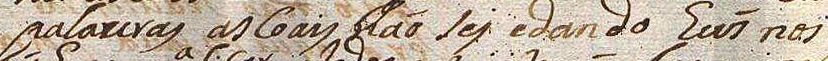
palauras as Coais naõ sej e dando hus̄ nos
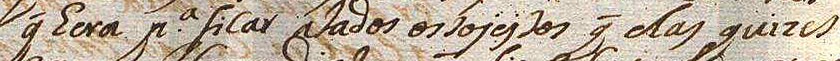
q̄ hera p.a ficar atados os sojejtos q̄ elas quizes
